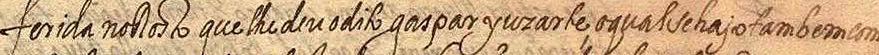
ferida no Rosto que lhe deu o dito gaspar yuzarte, o qual se haja tambem com
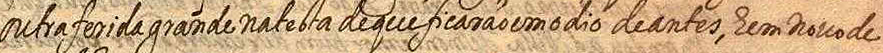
outra ferida grande na testa de que ficarão em odio de antes, E em nouo de
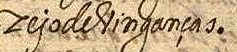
zejo de Vinganças.
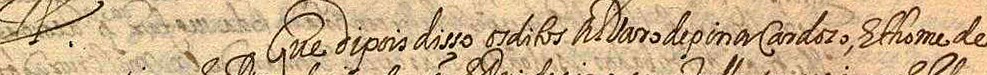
Pa Que dipois disso os ditos aluaro de pina Cardozo, E thome de
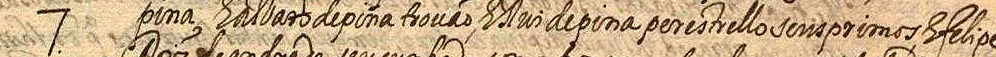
7. pina, E alvaro de pina trouão, E Rui de pina perestrello seus primos, E felipe
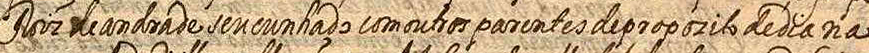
Roiz̄ de andrade seu cunhado com outros parentes de propozito de dia na
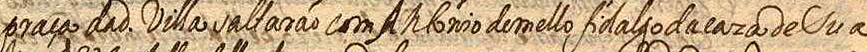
praça da d. Villa saltarão com Antonio de mello fidalgo da caza de sua
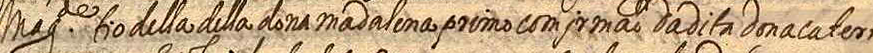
Mag.de tio della della dona madalena primo com jrmão da dita dona cateri
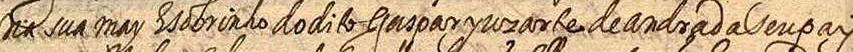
na sua may E sobrinho do dito Gaspar yuzarte de andrada seu pay,
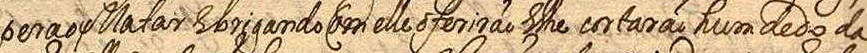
pera o Matar E brigando Com elle o ferirão E lhe cortarão hum dedo da
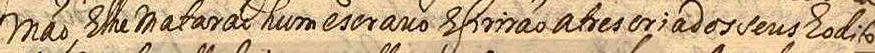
mão, E lhe matarão hum escrauo E firirão a tres criados seus E o dito
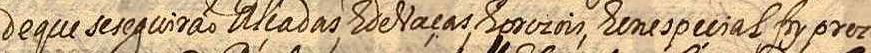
de que se seguirão alçadas, E devaças, E prezois, E en especial foy prezo
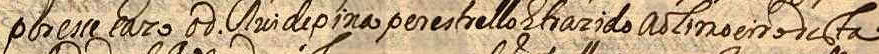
por esse cazo o d. Rui de pina perestrello E trazido ao limoeiro desta
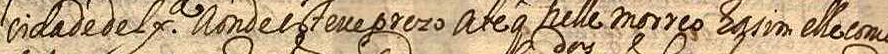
cidade de Lx.a aonde esteue prezo ate q̄ nelle morreo E asim elle como
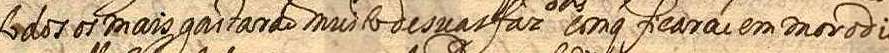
todos os mais gastarão muito de suas fazdas com q̄ ficarão em mor odio
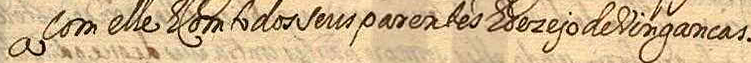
com ellle E Com todos seus parentes E dezejo de Vinganças.
